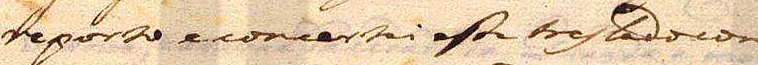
reporto e concertei este treslado com
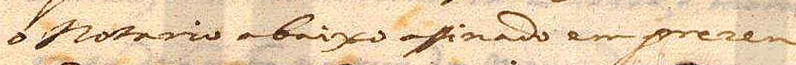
o notario abaixo assinado em prezen
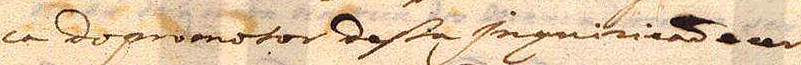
ca do promotor desta jnquizicaõ e cer
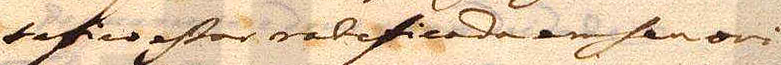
tefico estar rateficada em seu ori
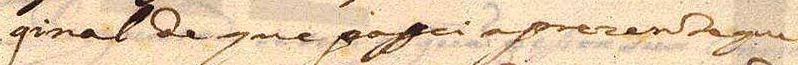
ginal de que passei a prezente que
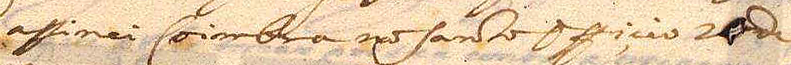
assinei Coimbra no Santo Offiçio 2_ de
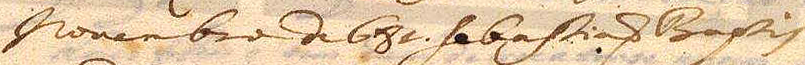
Nouembro de 681. sebastiaõ Baptis
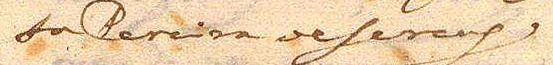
ta Pereira o escreuj
